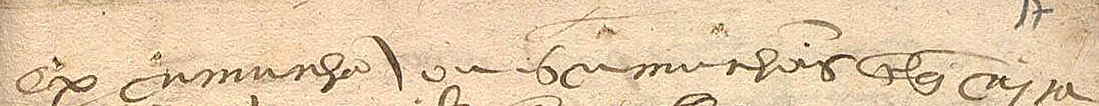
excumunhaõ ou escumunhõis ē q̄ cajra
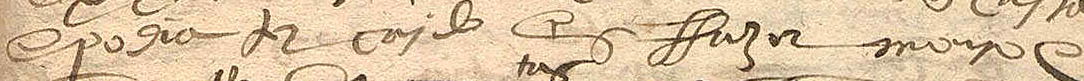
e podia ter cajdo e se ffazer mouro e
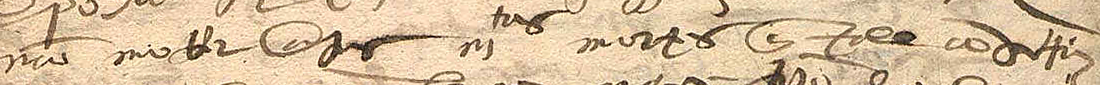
não moRer ātes mtas mortes q̄ tall cōsētir
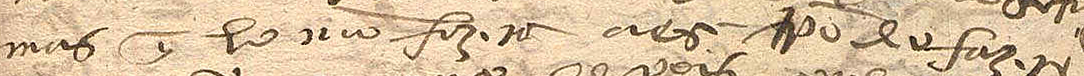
mas q̄ ho naõ fezera a ese tpō de o fazerē
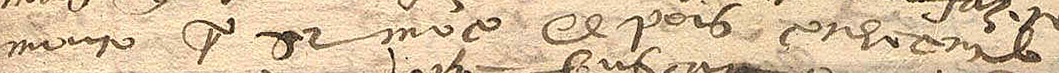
mouro p̄o ser moço e depois conhecemdo
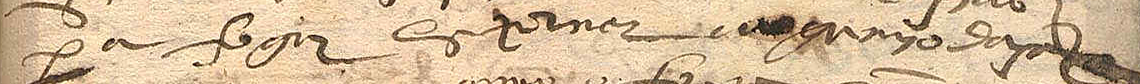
ꝑa fogir e se tornar ao gremjo da sāta
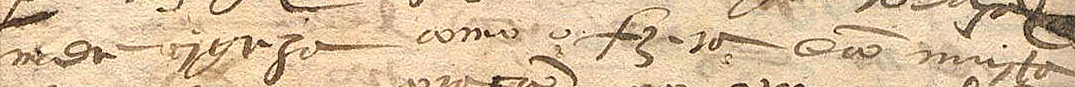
madre igreJa como o fezera e c̄o mujta
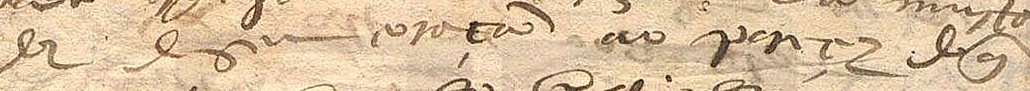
dor de seu coração ao parecer do q̄
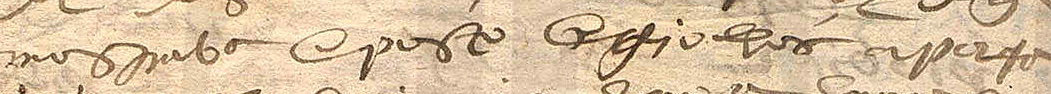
mostrava e posto ē giolhos a porta
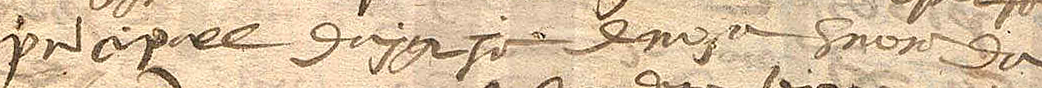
prīcipall da jgreJa de nosa Snora da
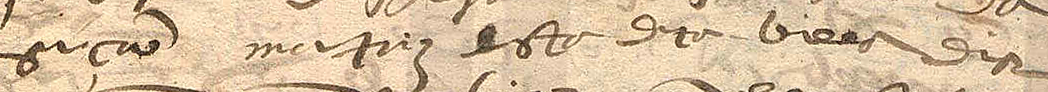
sunção matriz desta dita villa dise
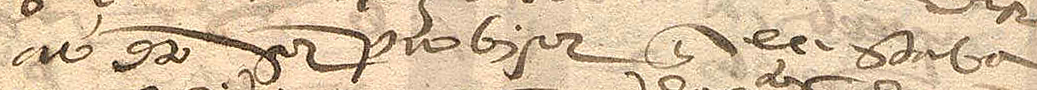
ao dt̄o s̄or provjsor q̄ elle estava
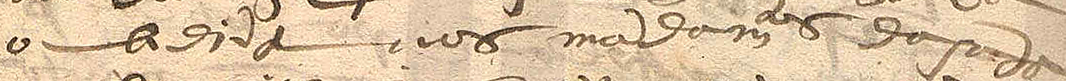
obediēte aos mādamtos da sāta
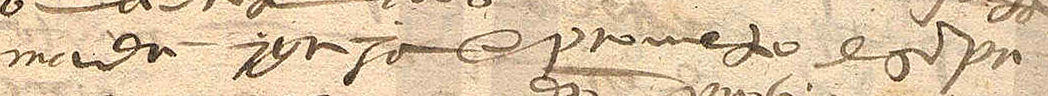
madre jgreJa e prometeo de sēpre
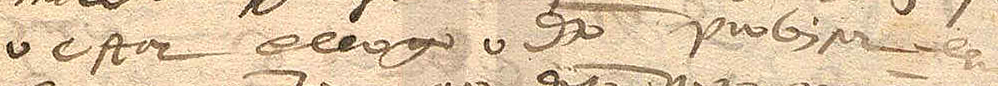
o estar e llogo o dt̄o provjsor lhe
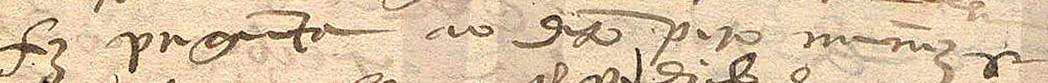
fez pregūta ao dito pero nun̄ez se
